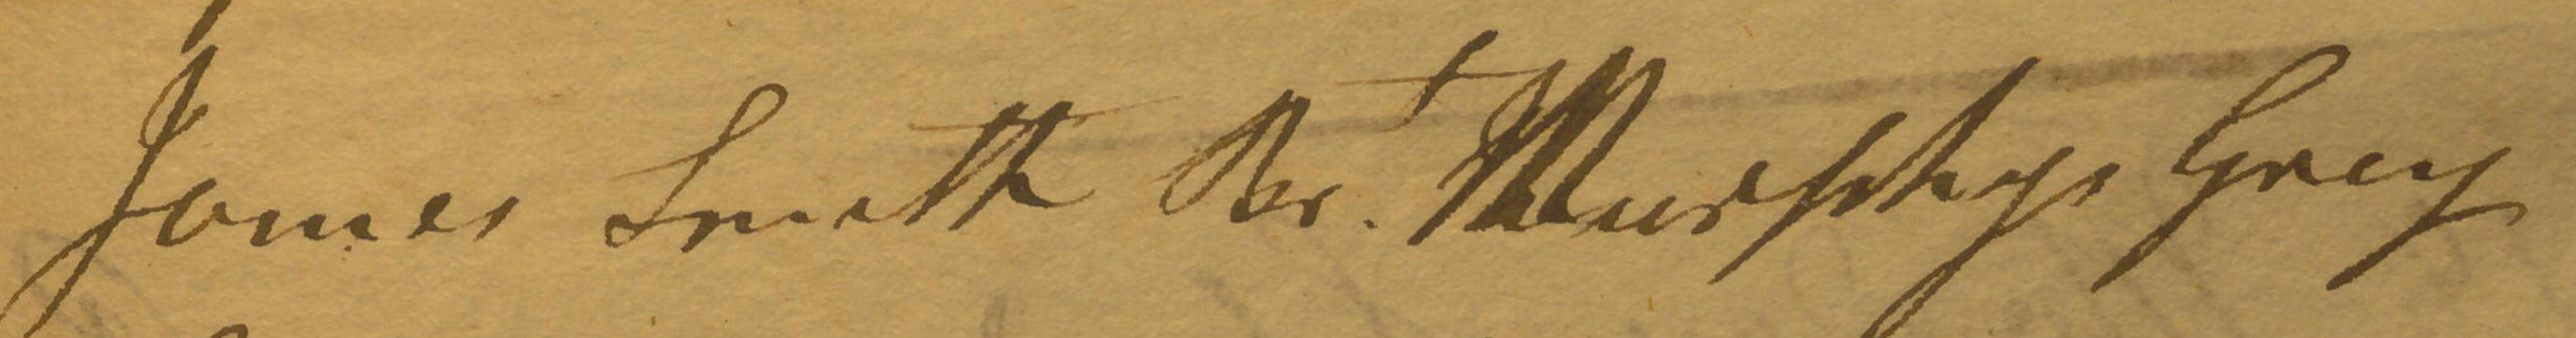James Smith Br^t. Murphys Grey
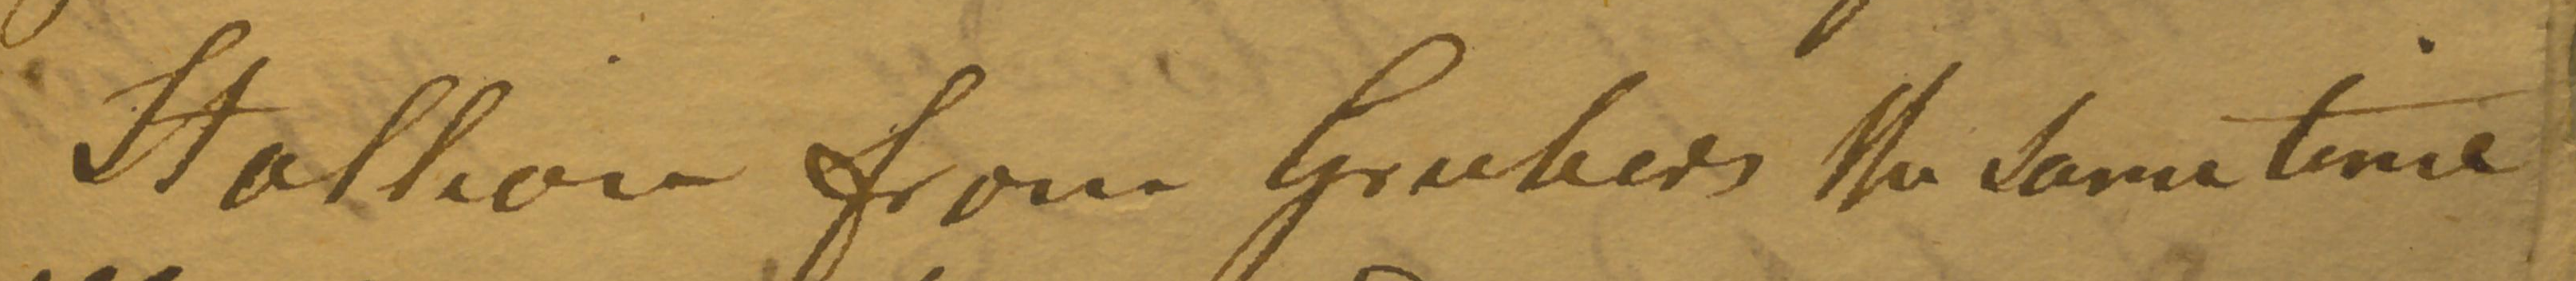Stallion from Grubers the Same time
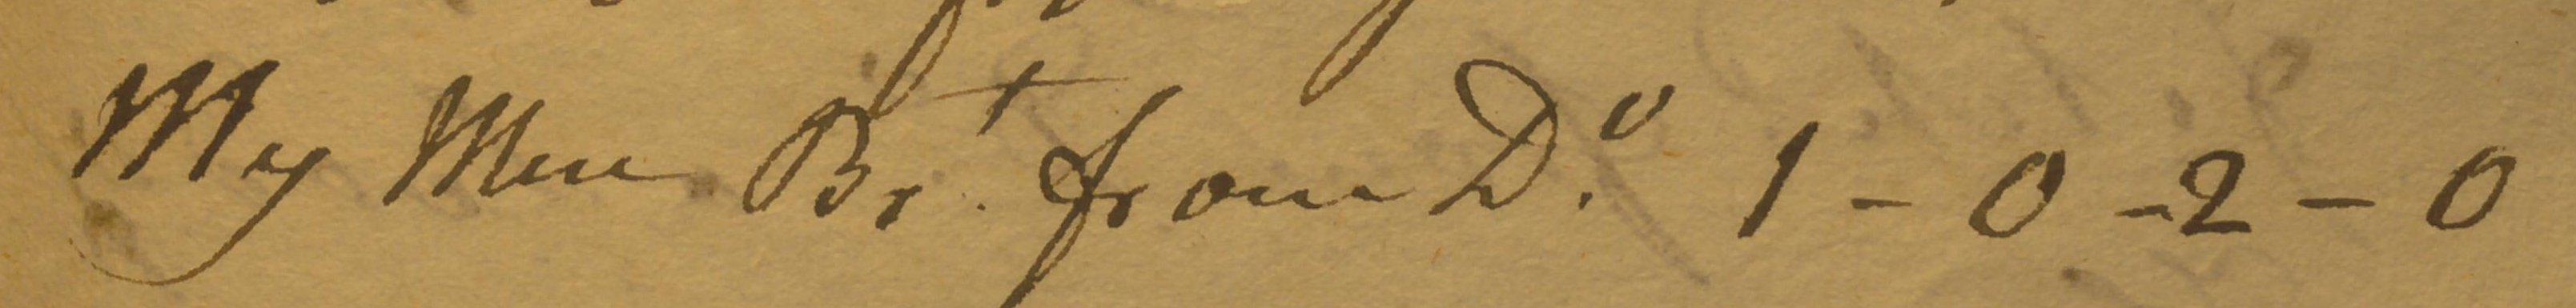My Mare Br^t. from D^o. 1-0-2-0
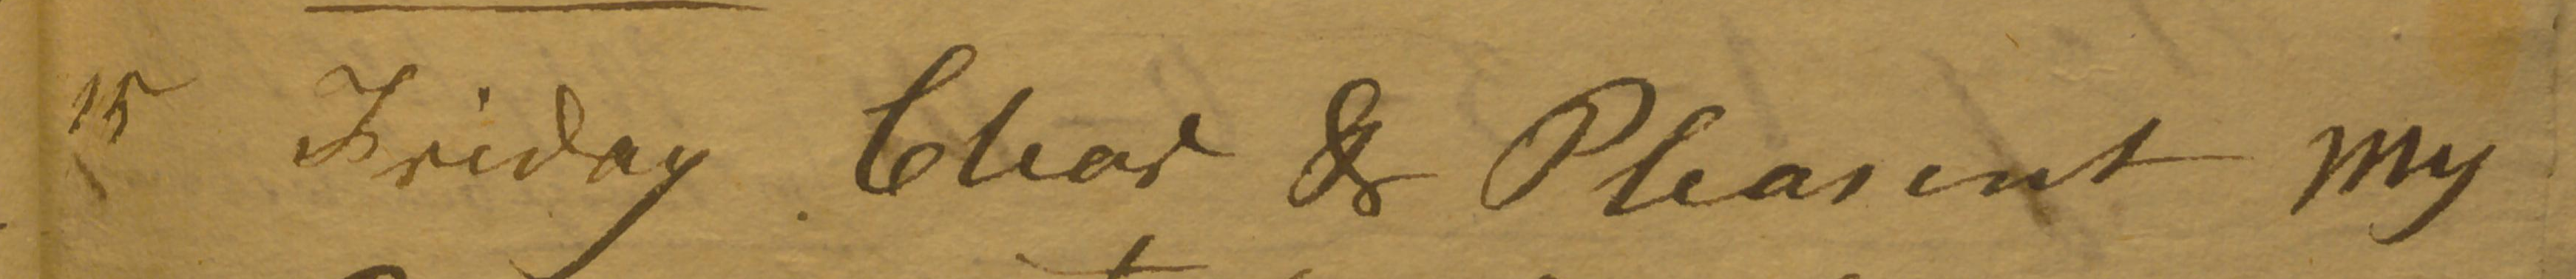25 Friday Clear & Pleasent My
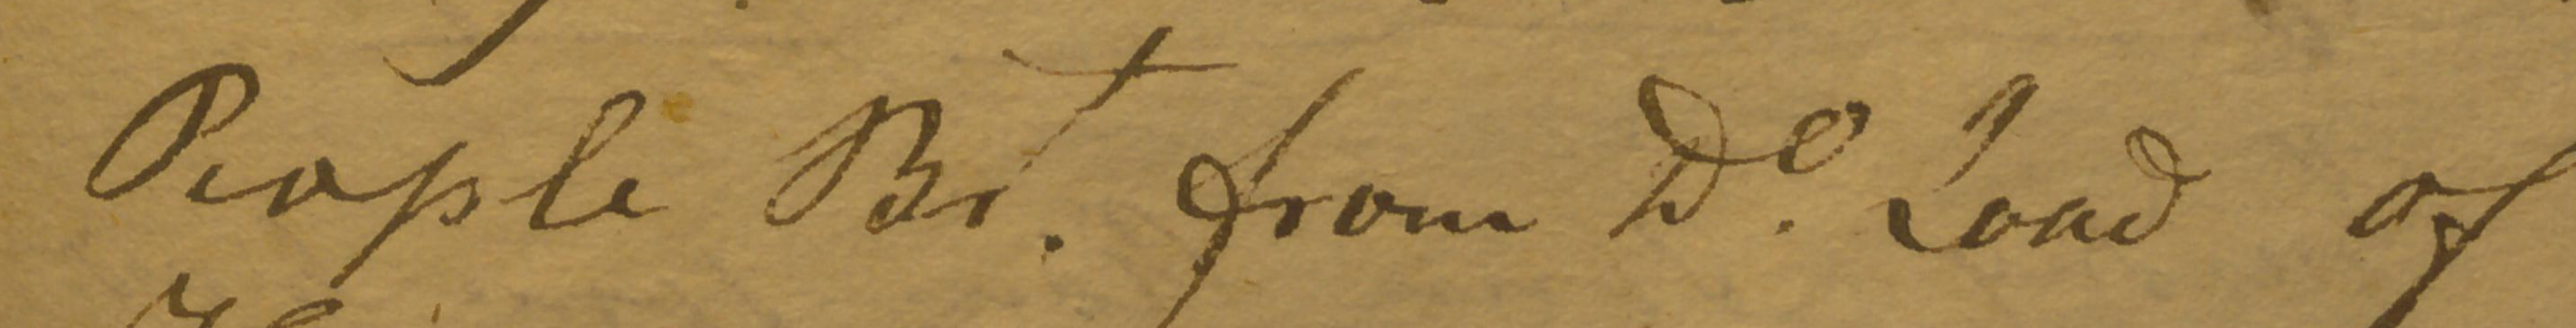People Br^t. from D^o. Load of
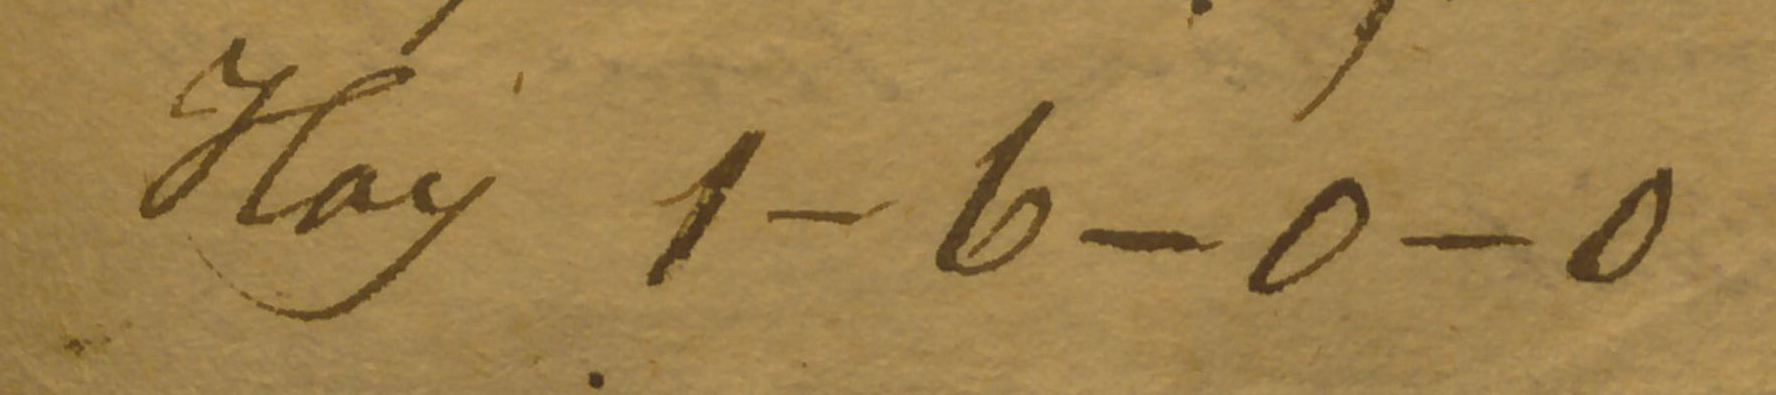Hay 1-6-0-0
